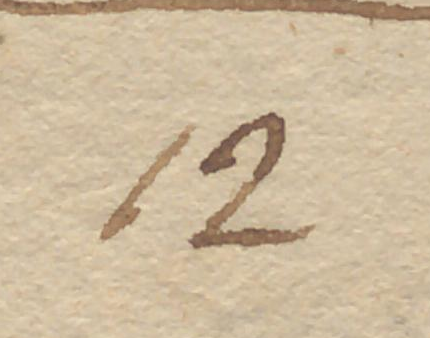12
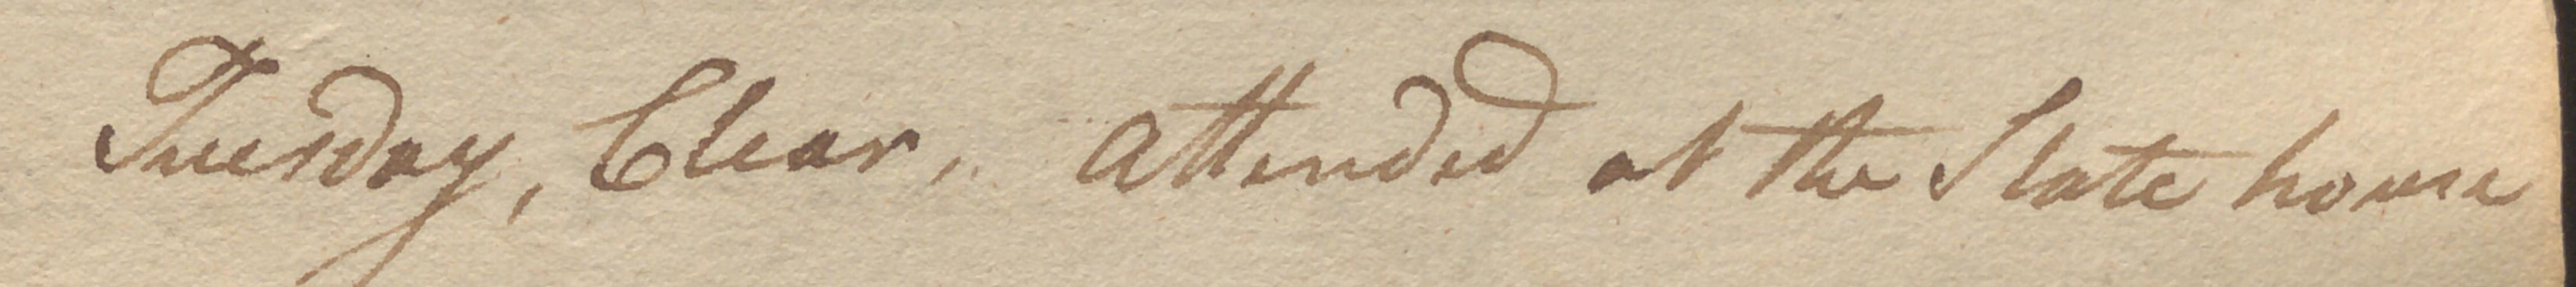Tuesday, Clear, attended at the State house
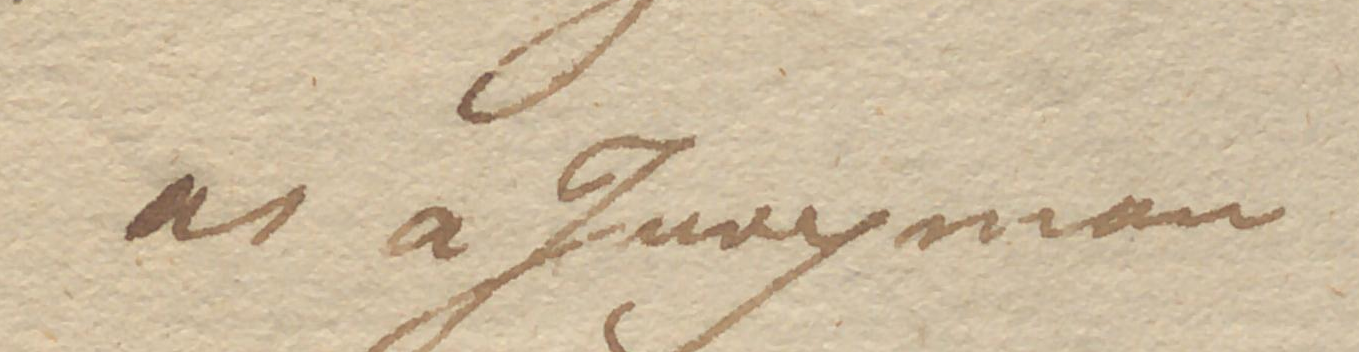as a Jury man
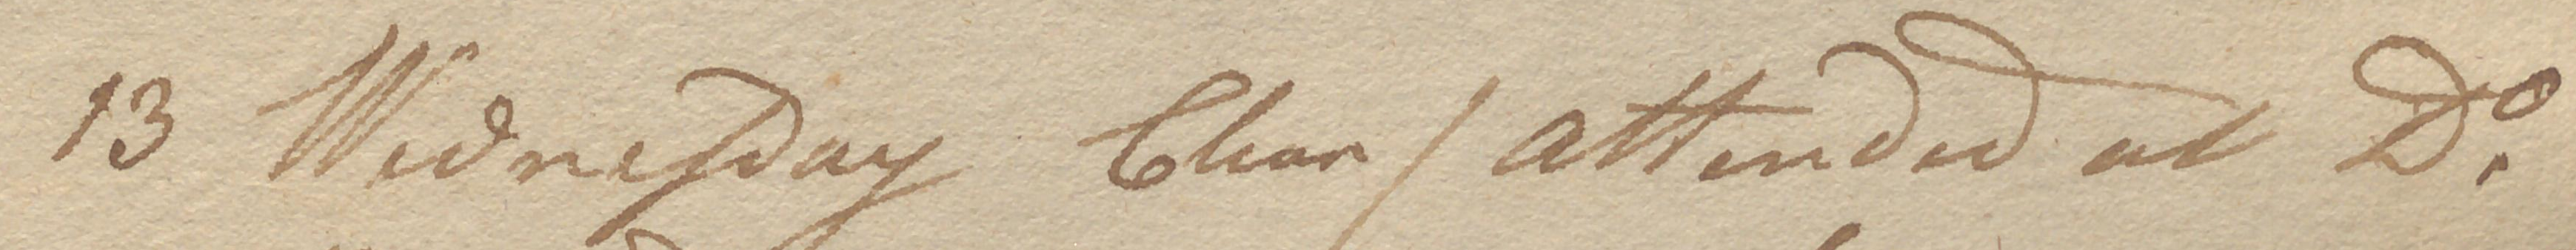13 Wednesday Clear / attended at D^o.
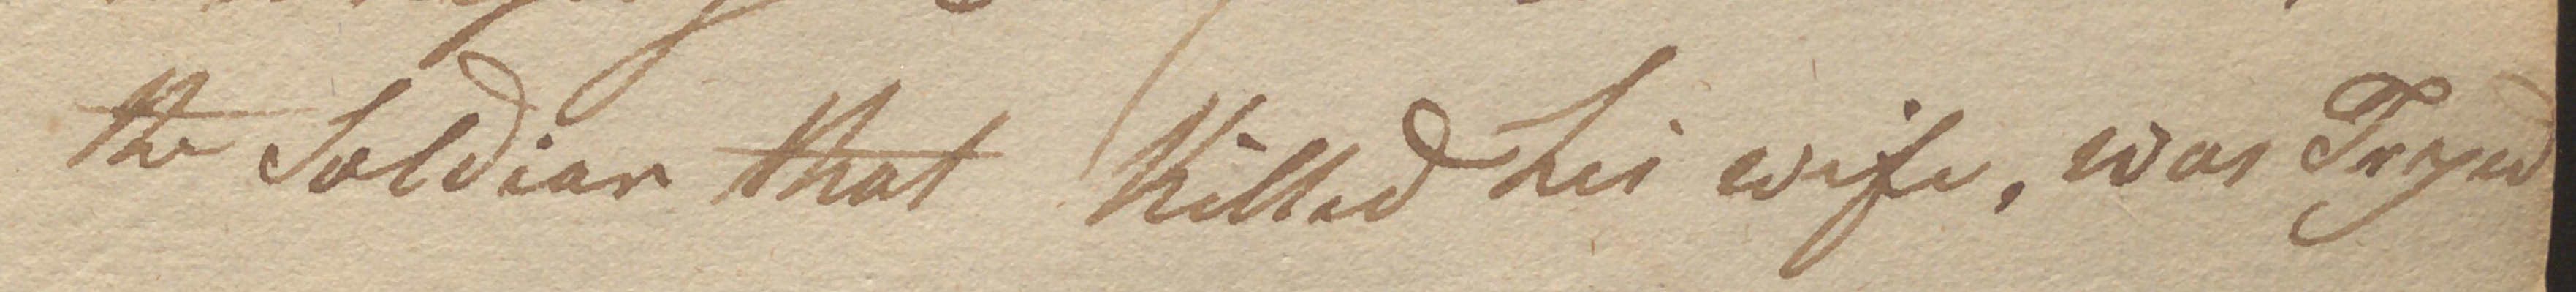the Soldiar that Killed his wife, was Tryed
